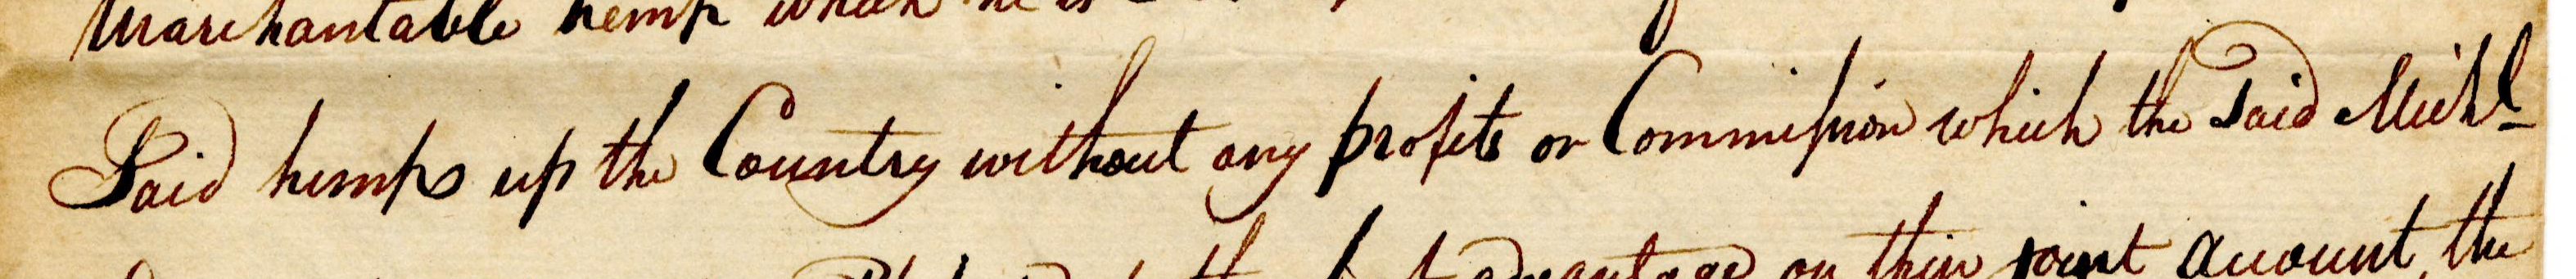said hemp up the Country without any profit or Commission which the said Mich^l
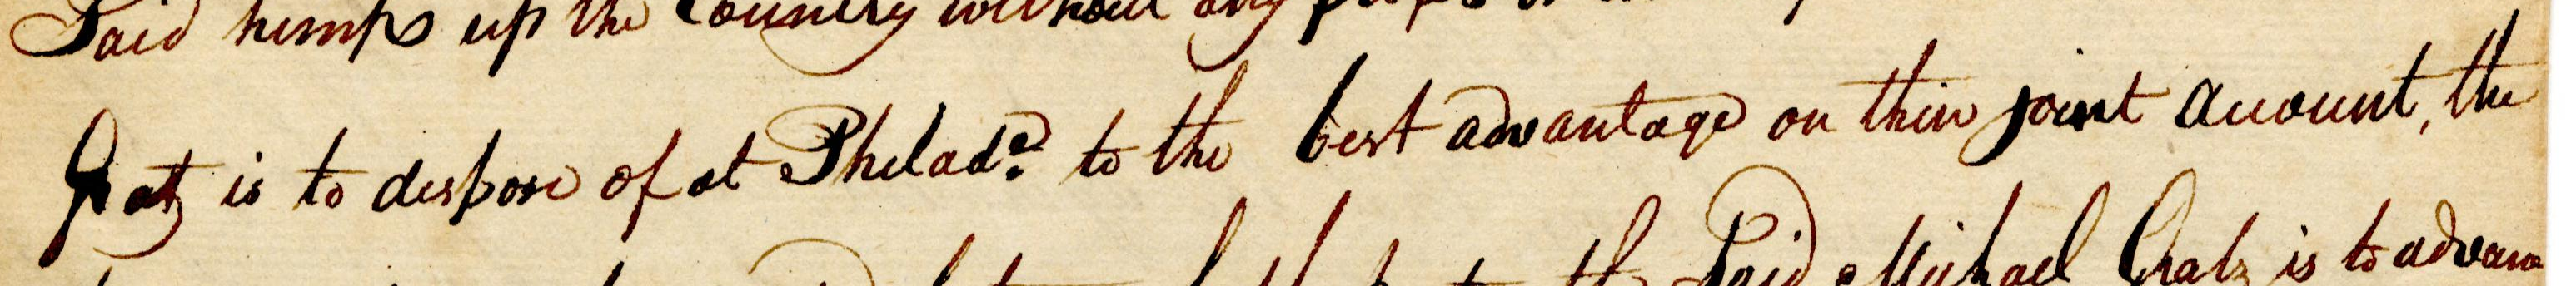Gratz, is to dispose of at Philad^a. to the best advantage on their joint account, the
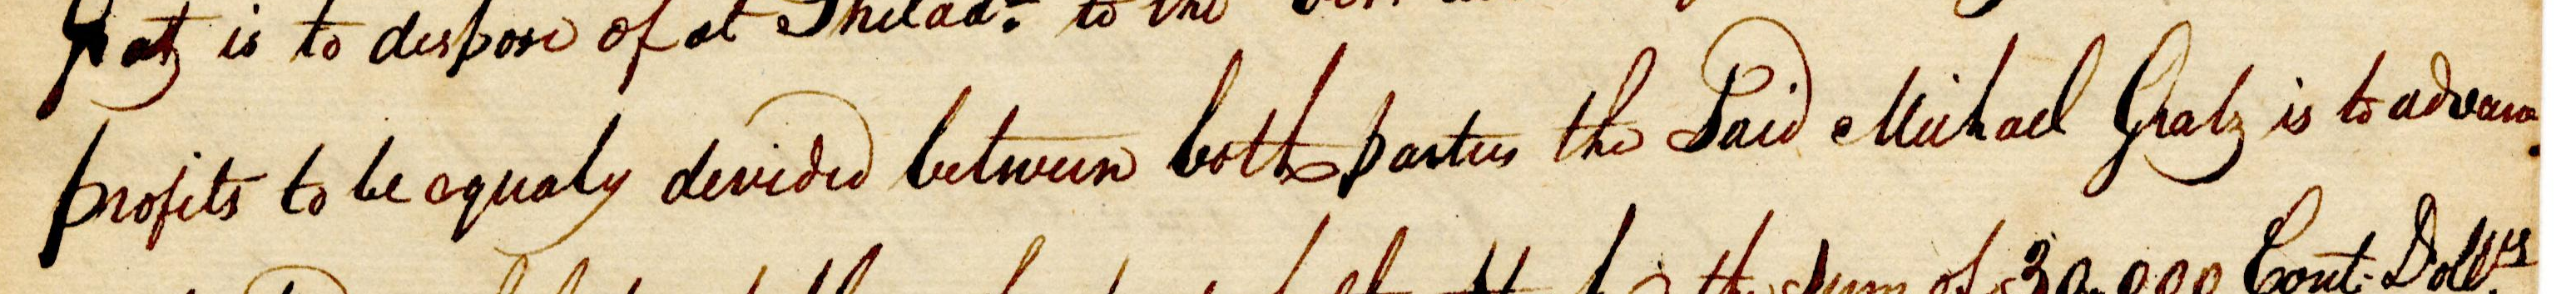profits to be equaly devided between both parties the Said Michael Grztz is to advance
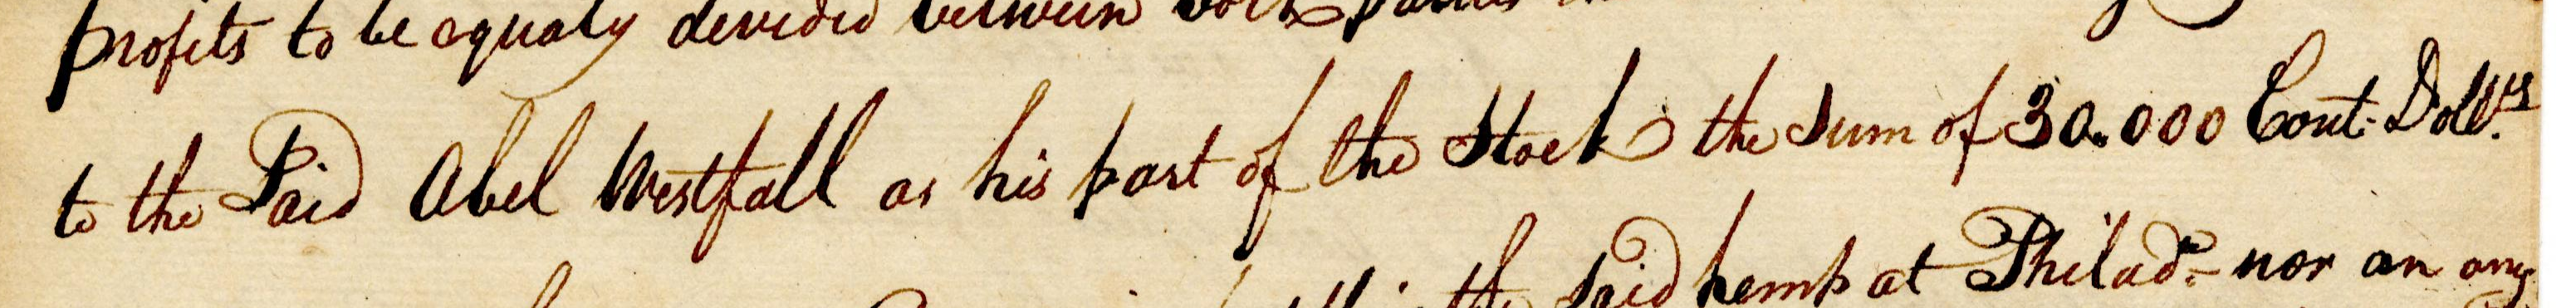to the said Abel Westfall as his part of the Stock the sum of 30,000 Cont Doll^rs
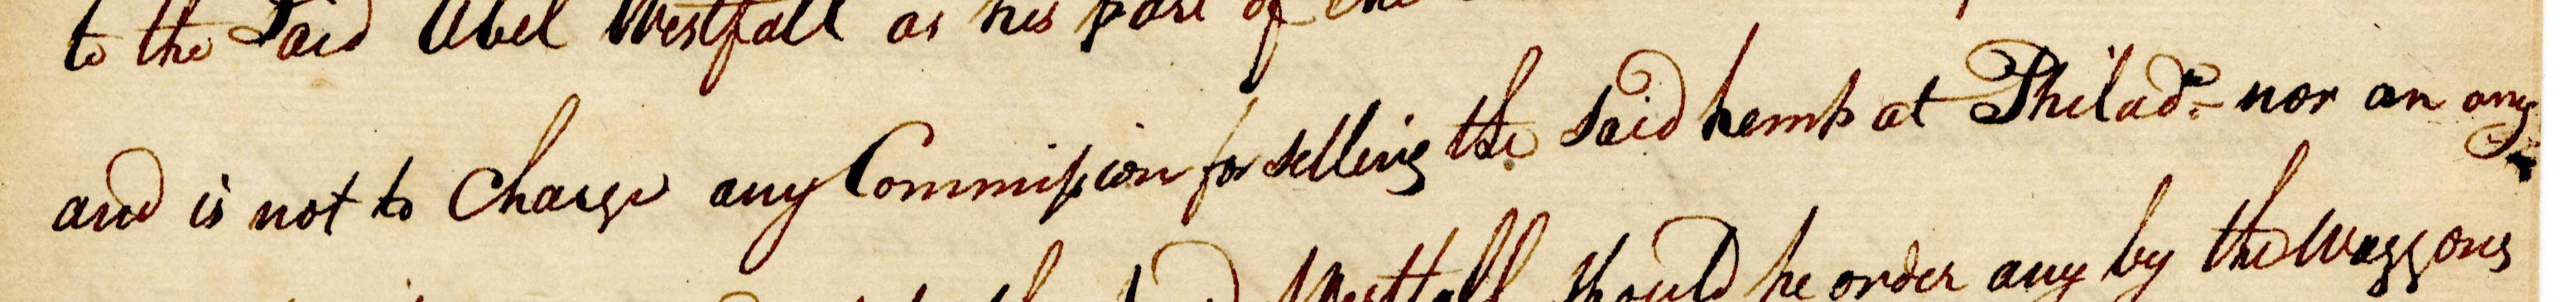and is not to Charge any Commission for selling the said hemp at Philad^a. nor an any
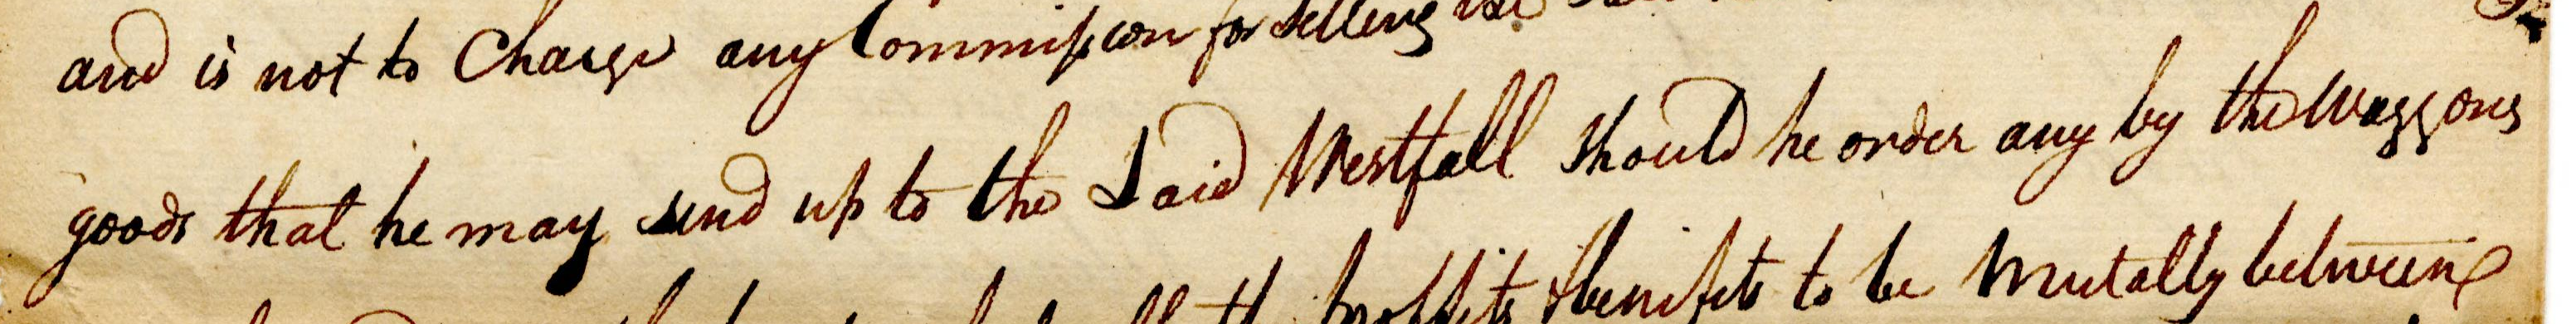goods that he may send up to the Said Westfall should he order any by the Waggons
